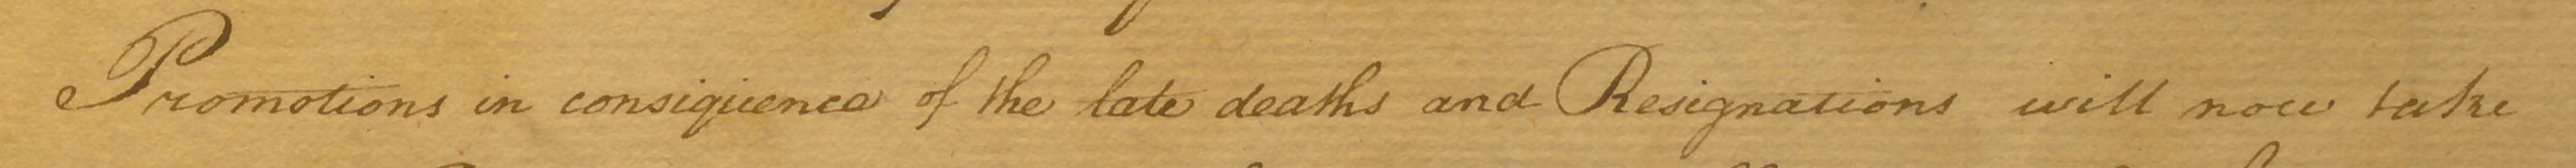Promotions in consiquence of the late deaths and Resignations will now take
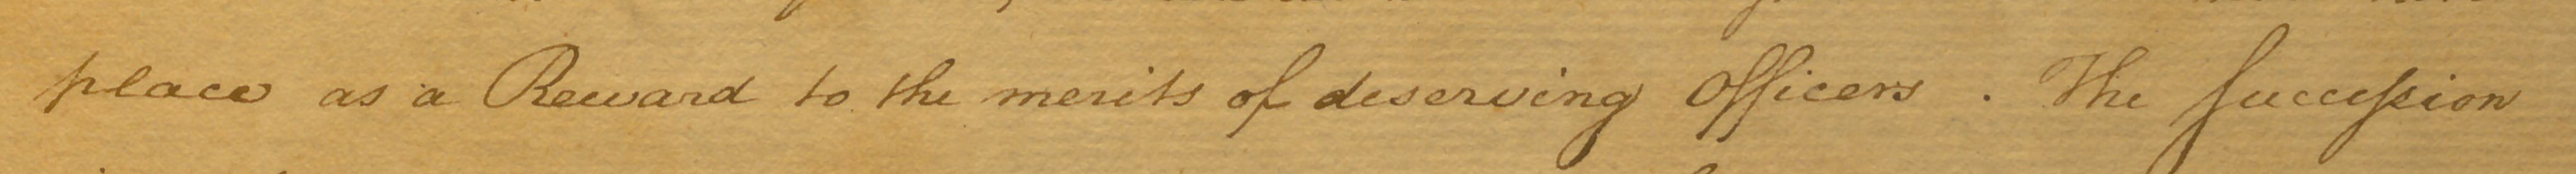place as a Reward to the merits of deserving Officers. The succession
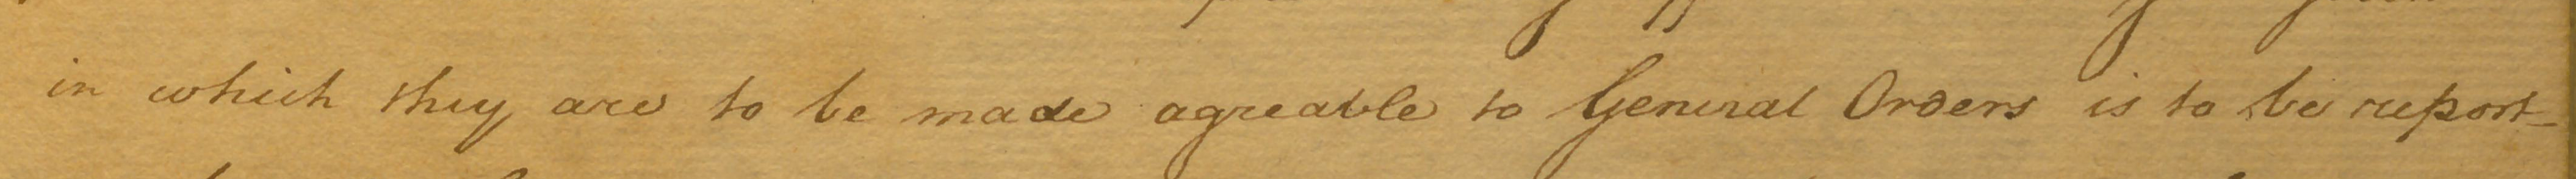in which they are to be made agreable to General Orders is to be report-
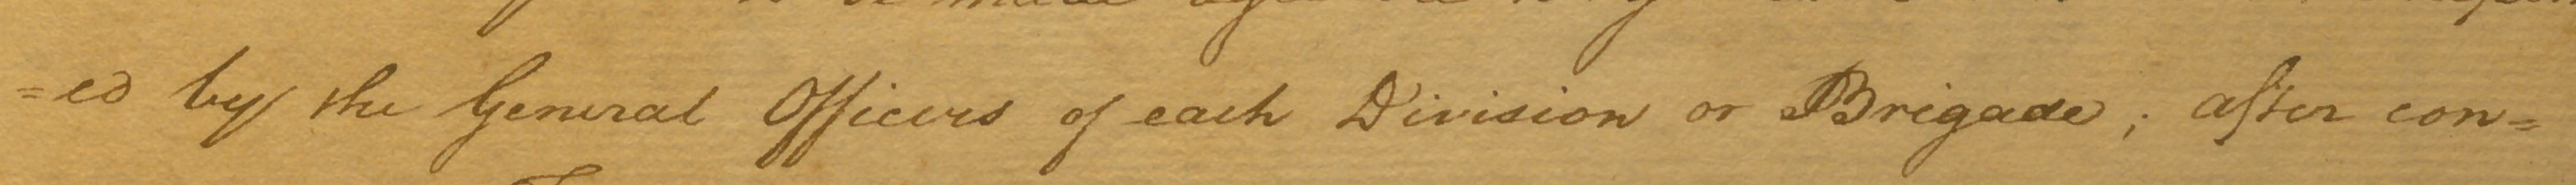-ed by the General Officers of each Division or Brigade; after con-
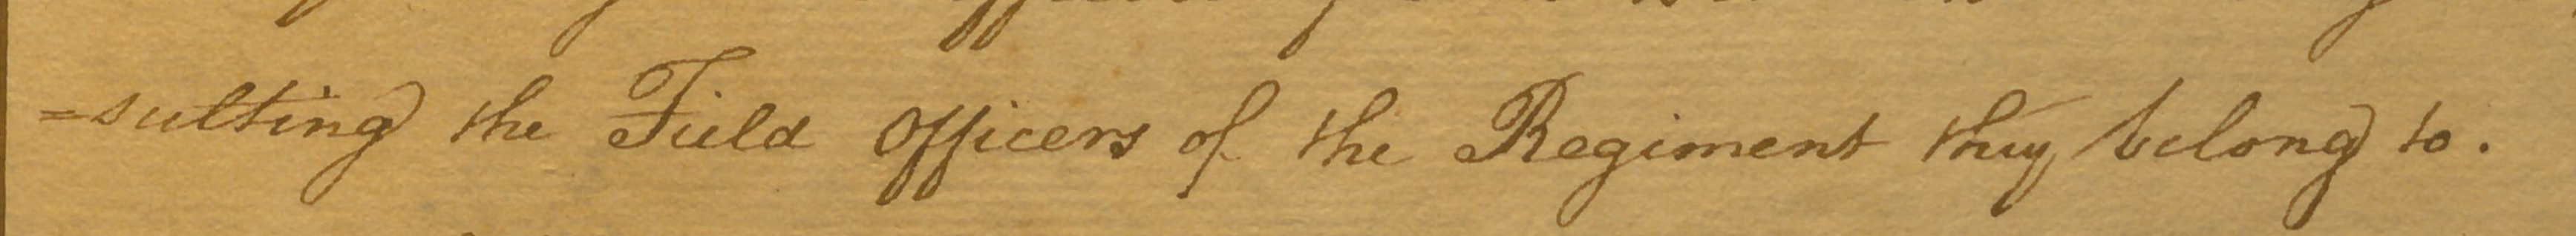-sulting the Field officers of the Regiment they belong to.
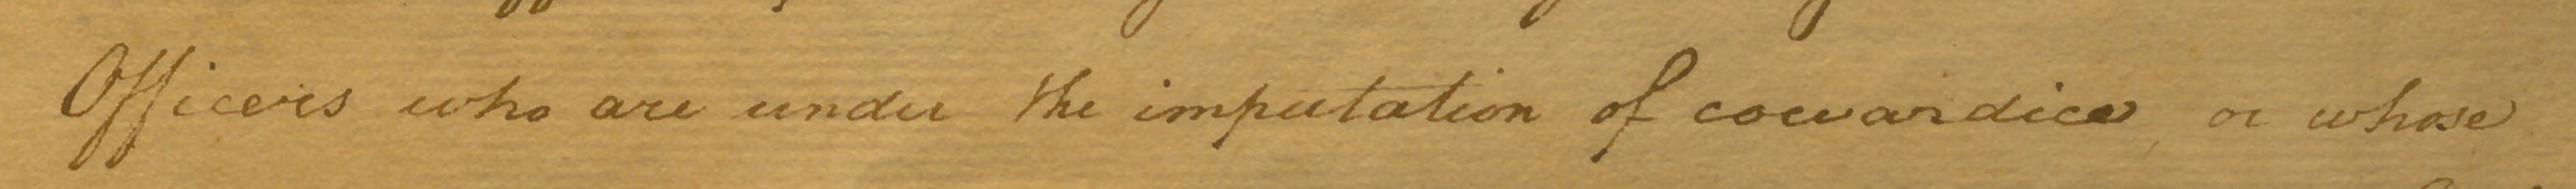Officers who are under the imputation of cowardice or whose
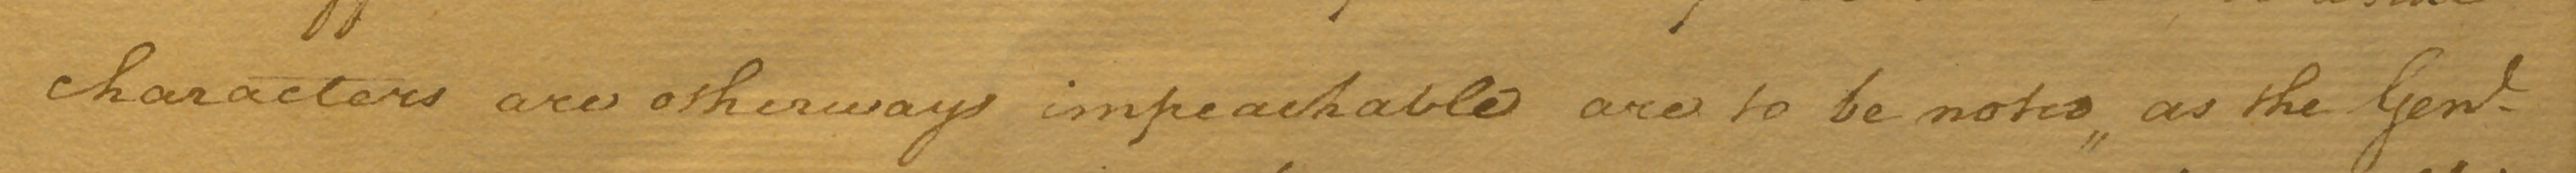characters are otherways impeachable are to be noted, as the Gen^l.
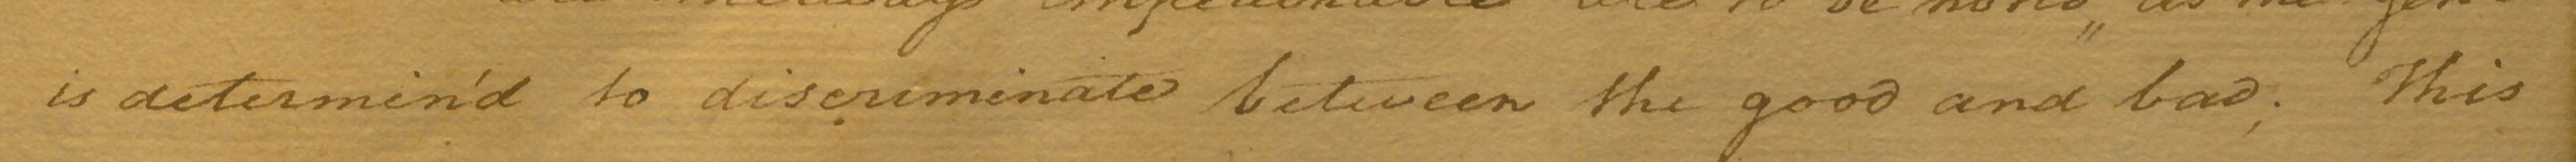is determin'd to discriminate between the good and bad. This
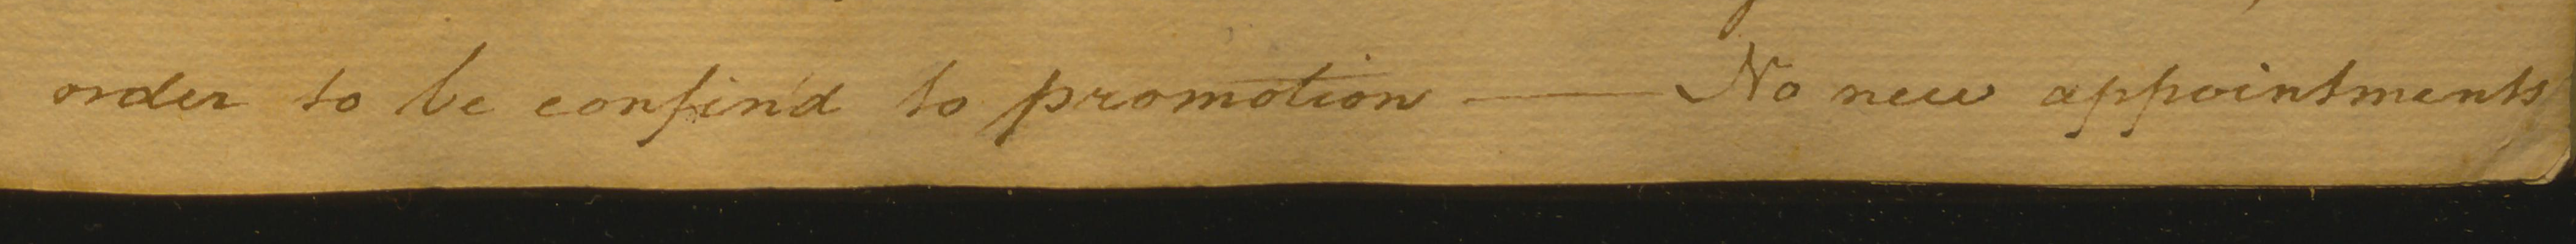order to be confin'd to promotion- No new appointments
